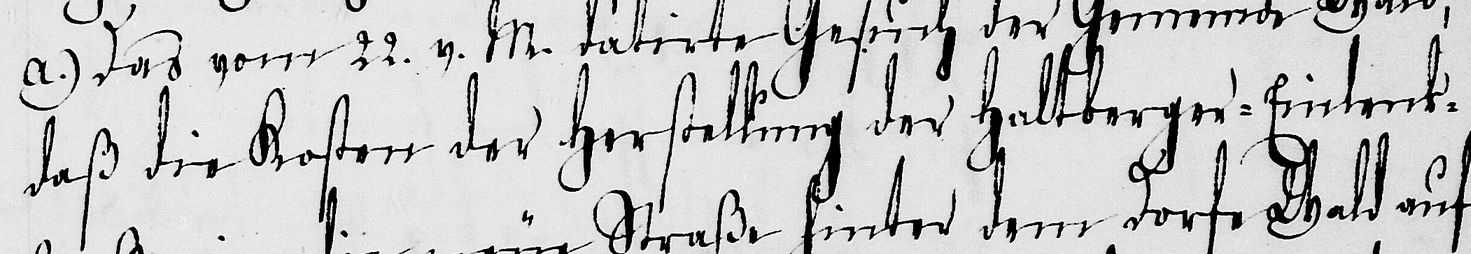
daß die Kosten der Herstellung der Haltberger-Einlenks¬
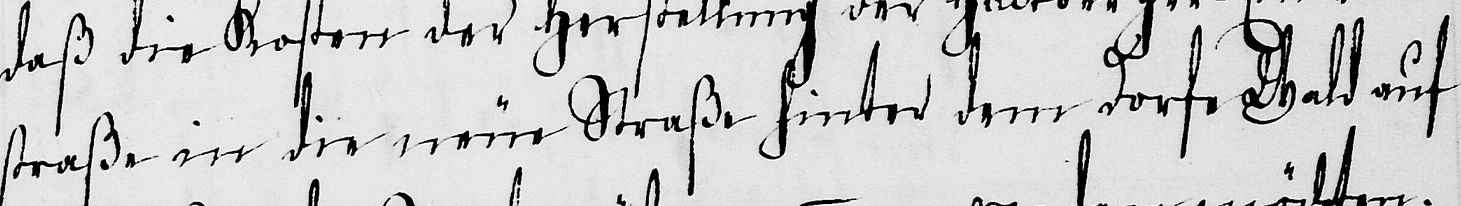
traße in die neue Straße hinter dem Dorfe Wald auf
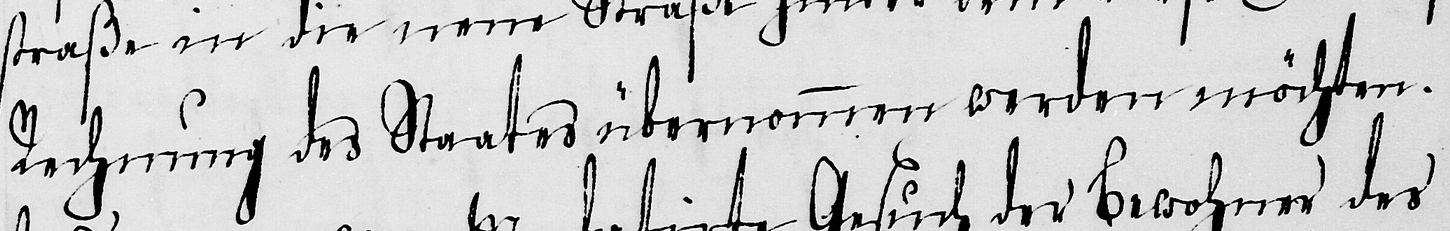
Rechnung des Staates übernommen werden möchten.
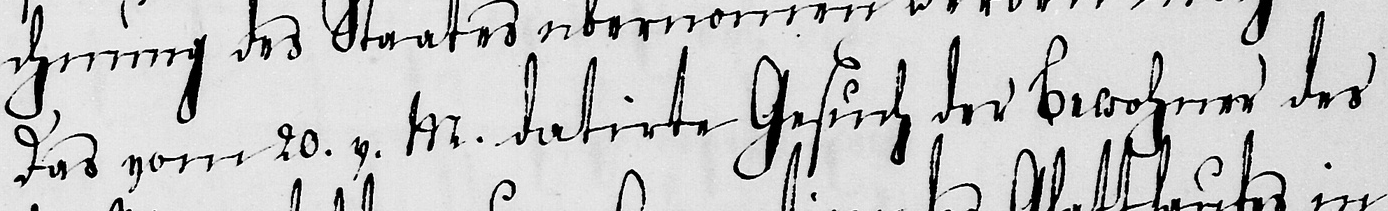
Das vom 20. v. M. datirte Gesuch der Bewohner des
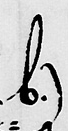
b.)
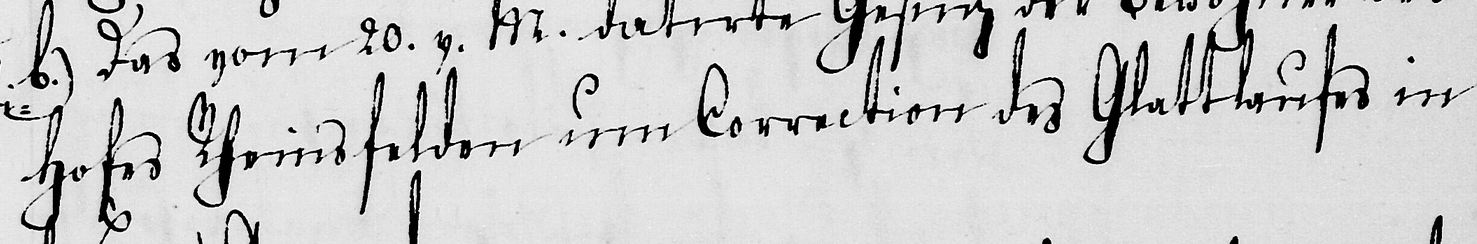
Hofes Rheinsfelden um Correction des Glattlaufes in
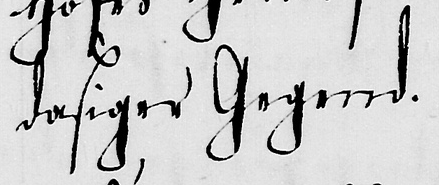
dasiger Gegend.
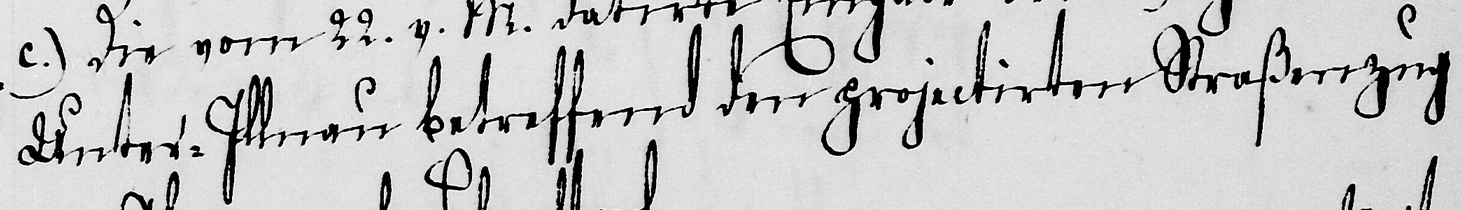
Unter-Illnau betreffend den projectirten Straßenzug
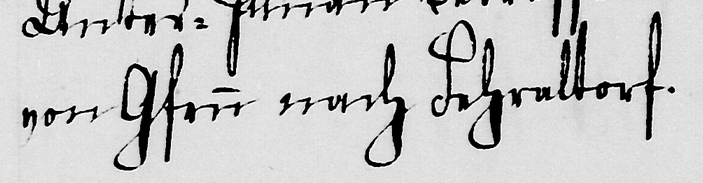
von Gfenn nach Fehraltorf.
